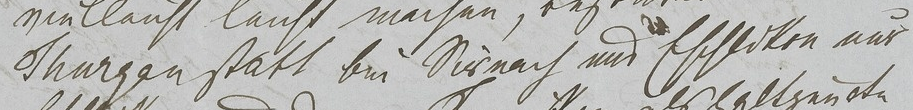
Thurgau statt bei Sirnach und Eschlikon nur
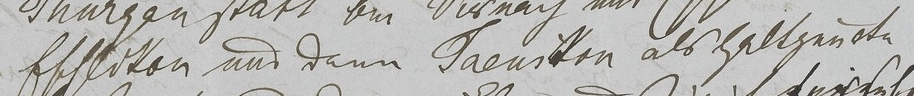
Eschlikon und dann Taenikon als Haltpuncte
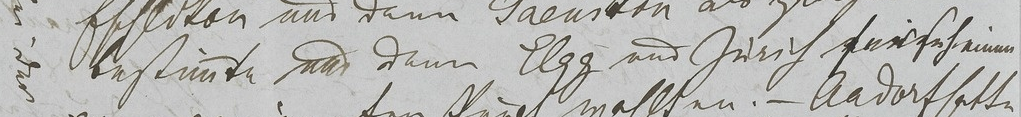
bestimmte und dann Elgg und Zürich für sich einen
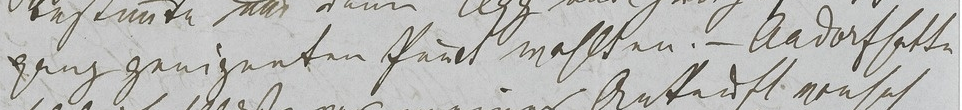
ganz geeigneten Punct wollten. – Aadorf hatte
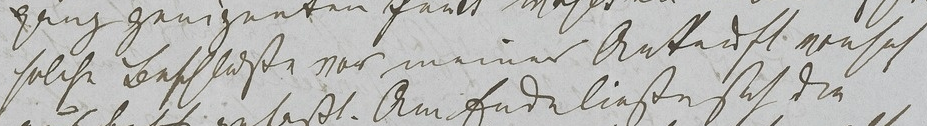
solche Beschlüße vor meiner Ankunft von sich
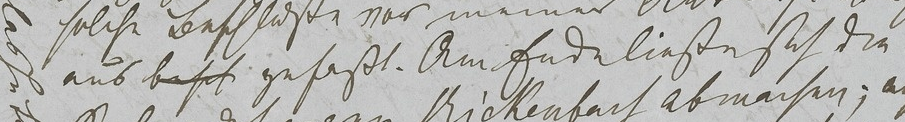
aus beschl gefaßt. Am Ende ließe sich die
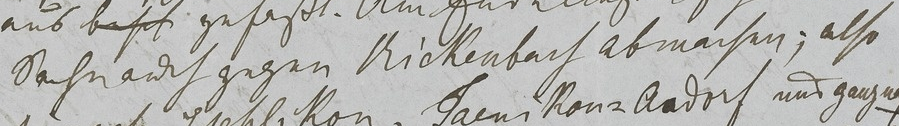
Sache auch gegen Rickenbach abmachen; also
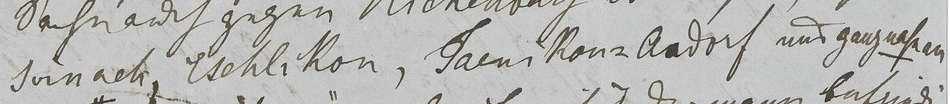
Sirnach, Eschlikon, Taenikon -Aadorf und ganz nahe an
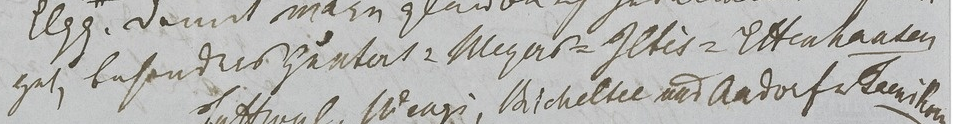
get, besonders Gunters- Meyers- Iltis-Ettenhausen
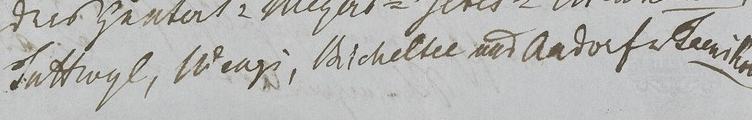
Tuttwyl, Wengi, Bichelsee und Aadorf -Taenikon.
